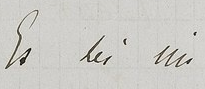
Es sei im
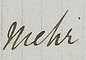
Plan den
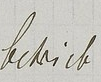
Betrieb
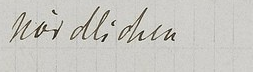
nördlichen
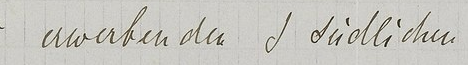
erwerbenden) südlichen
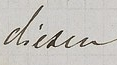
Bahnen
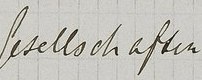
Gesellschaften
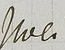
diesen
